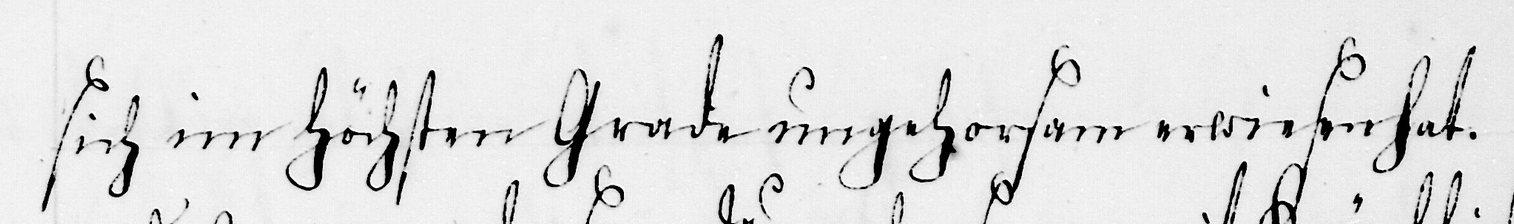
sich im Höchsten Grade ungehorsam erwiesen hat.
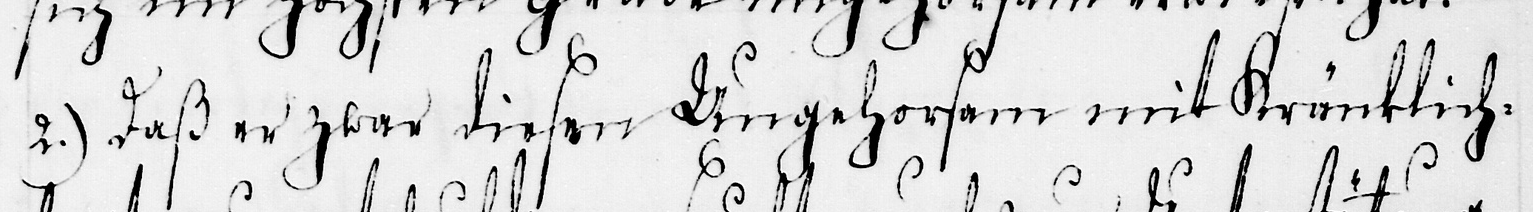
2.) Daß er zwar diesen Ungehorsam mit Kränklich¬
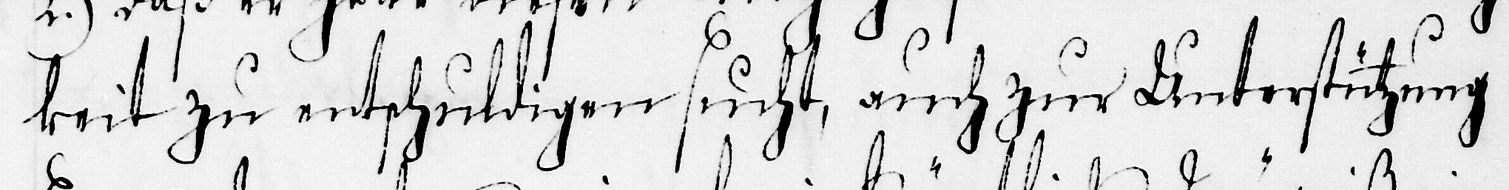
keit zu entschuldigen sucht, auch zur Unterstützung
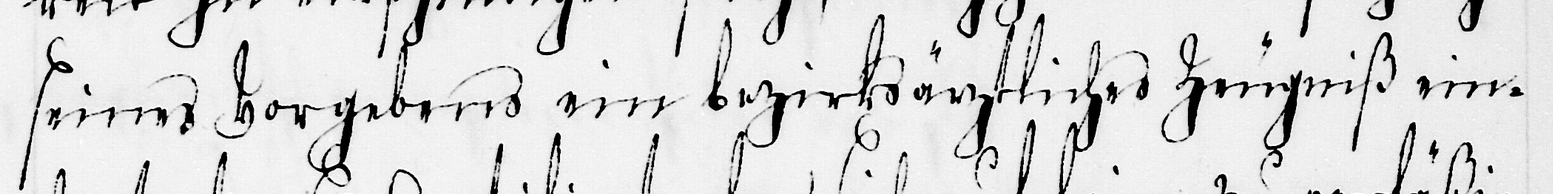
seines Vorgebens ein bezirksärztliches Zeugniß ein¬
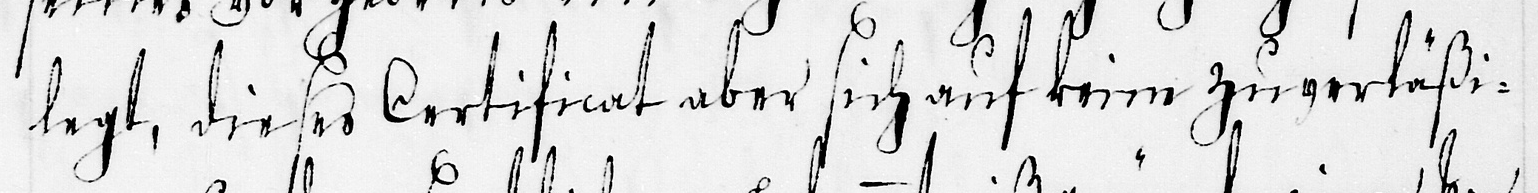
legt, dieses Certificat aber sich auf keine Zuverläßi¬
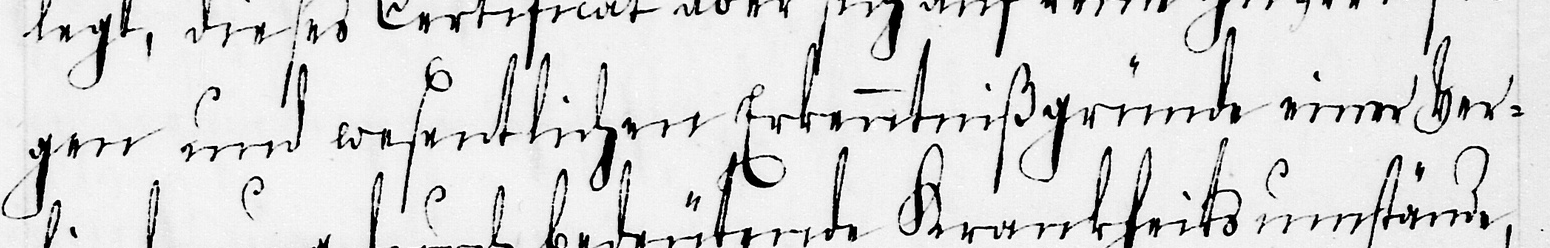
gen und wesentlichen Erkenntnißgründe einer Ver¬
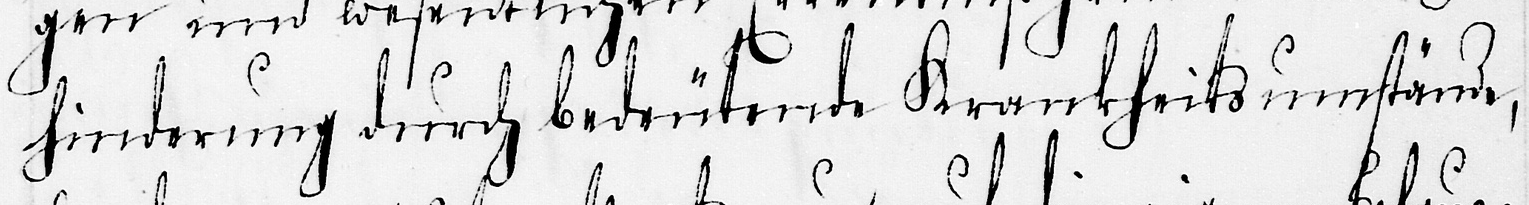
hinderung durch bedeutende Krankheitsumstände,
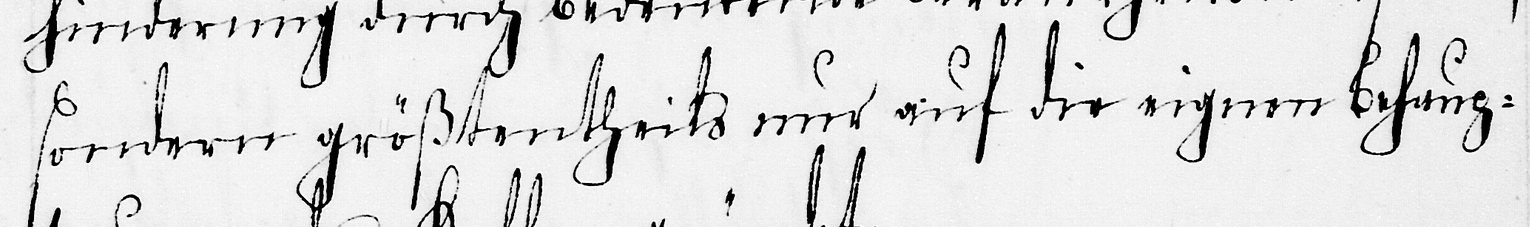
sondern größtentheils nur auf die eignen Behaup¬
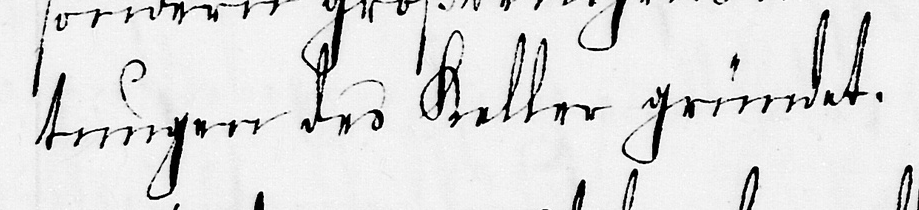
tungen des Keller gründet.
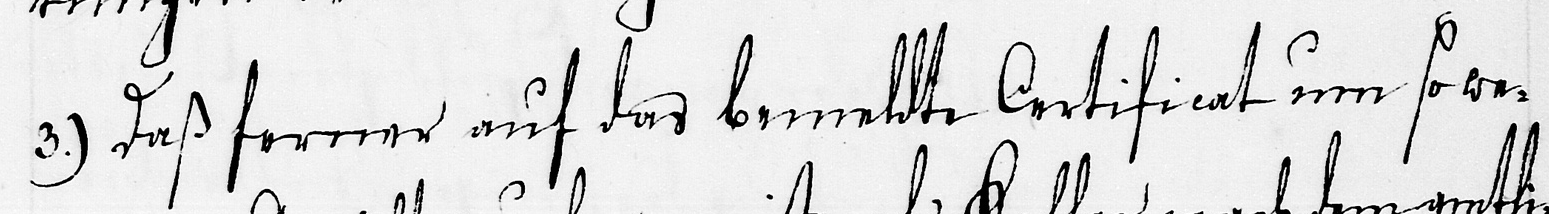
3.) Daß ferner auf das bemeldte Certificat um so we¬
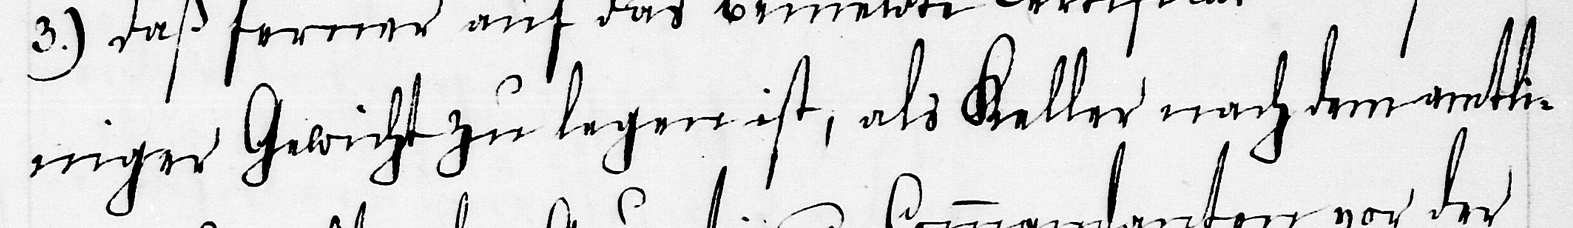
niger Gewicht zu legen ist, als Keller nach dem amtli¬
